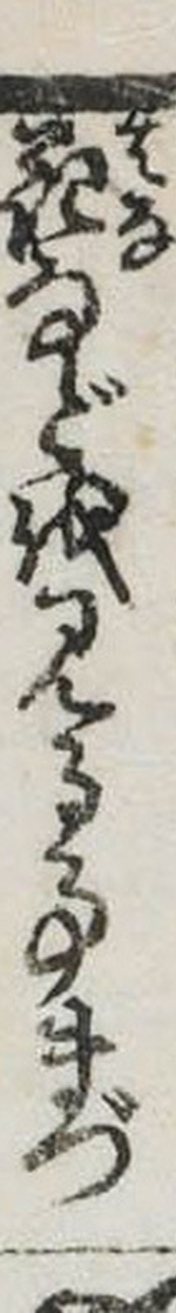花などを見る事まづ
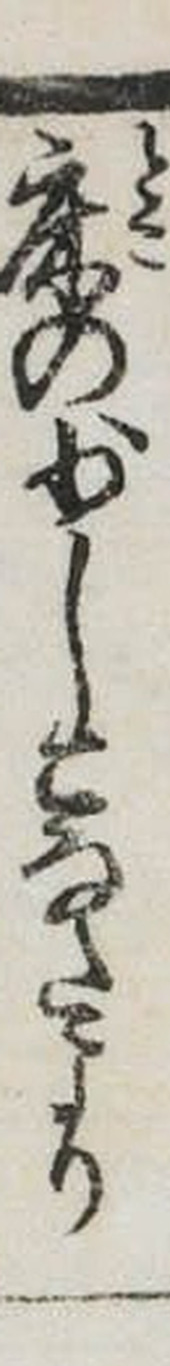床の少しこなたより
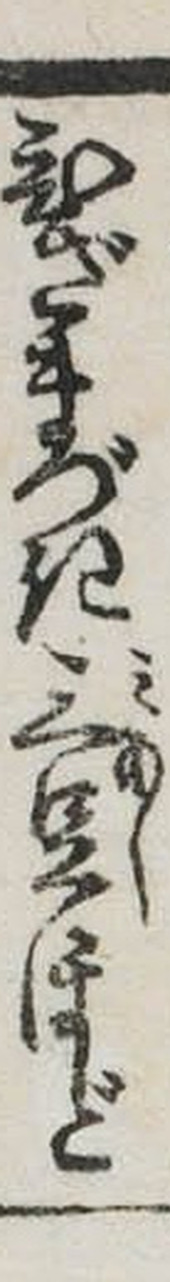ひざまづき三足ほど
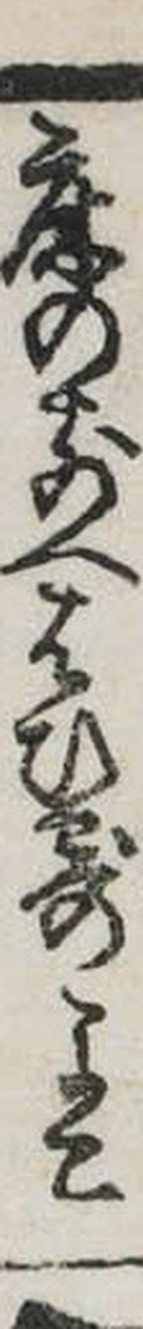床の前へはひ寄よこ
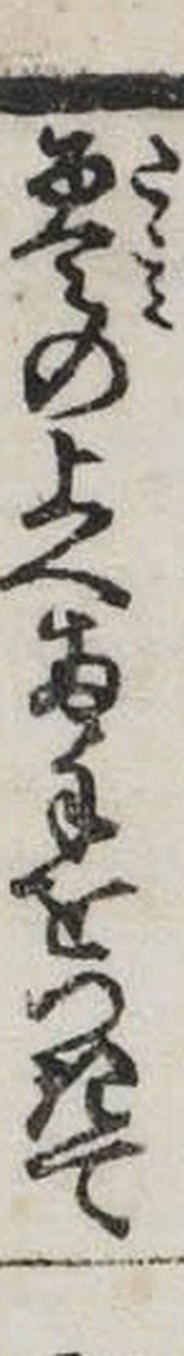畳の上へ両手をつきて
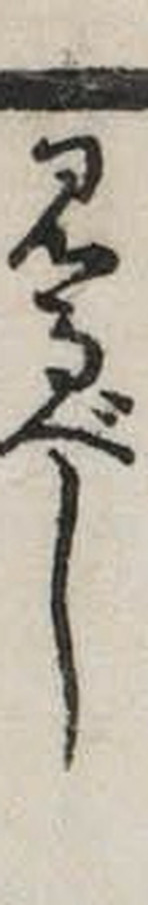見るべし
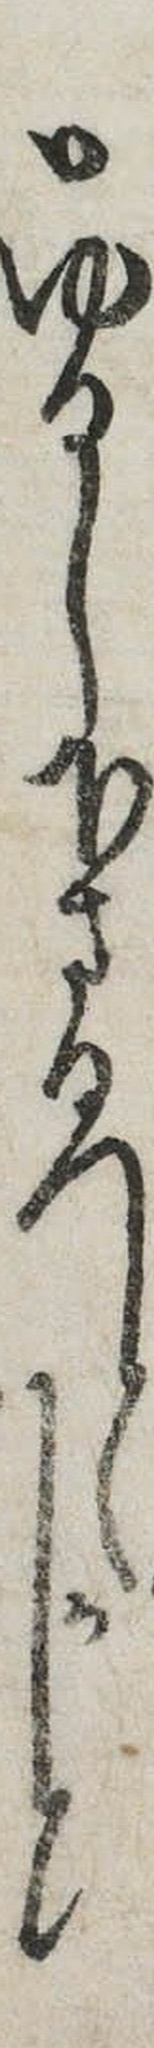御ゆるし下さるへく候かしく
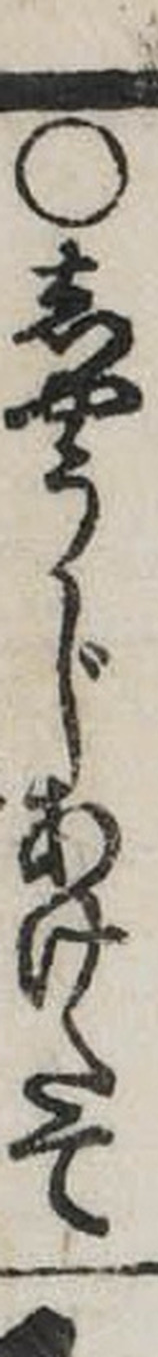○しやうじあけたて
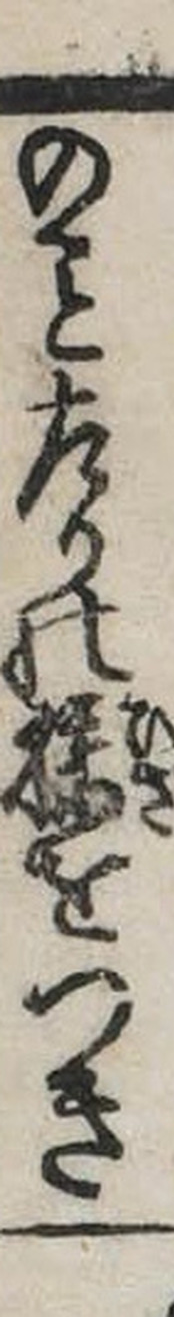のこと左りの膝をつき

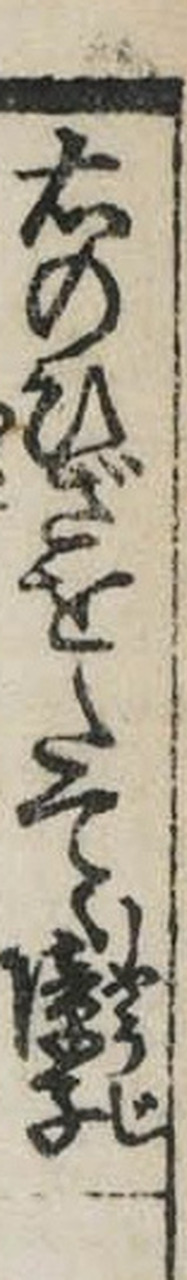右のひざをたてゝ障子
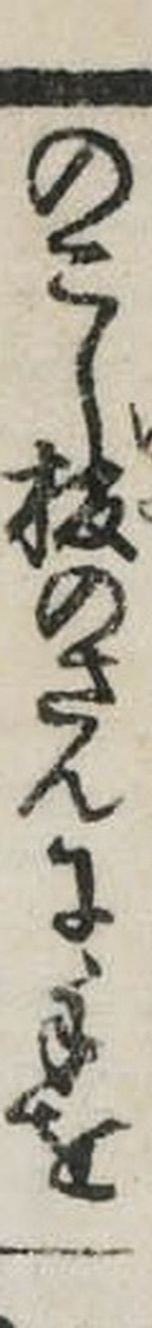のこし板のさんに手を
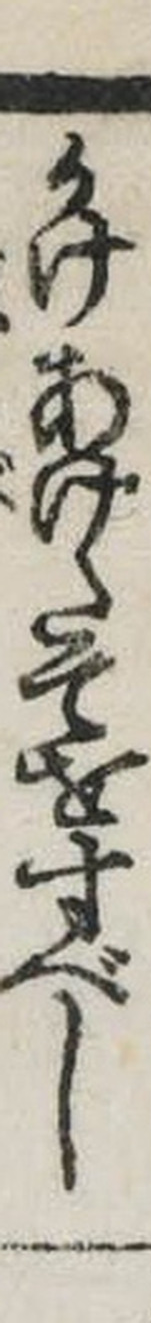かけあけたてをすべし
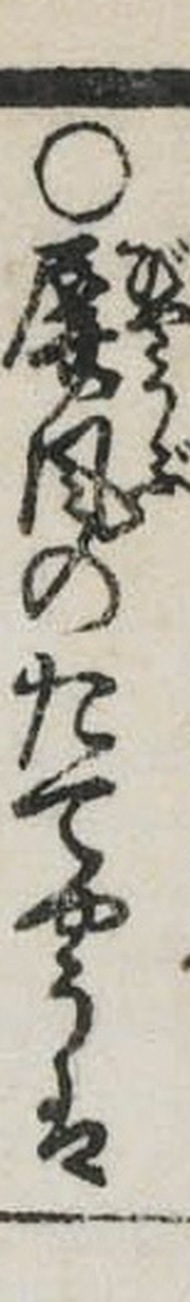○屏風のたてやうは
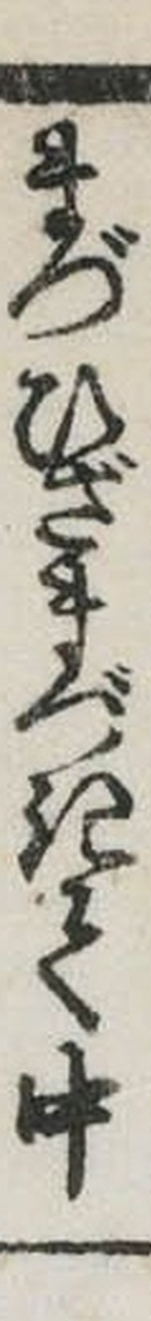まづひざまづきて中
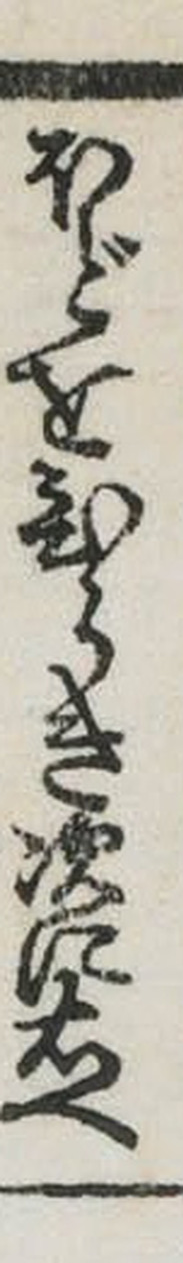ほどをひらき次に右へ
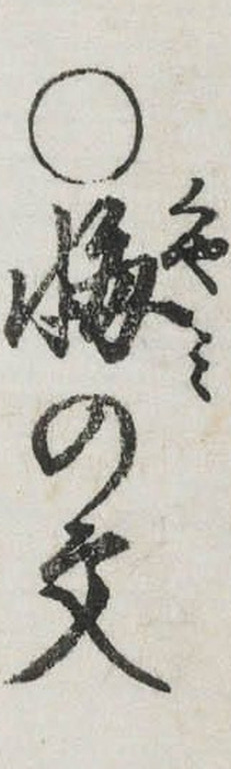○悔の文
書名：頭書萬用婦人手紙之文言
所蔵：東京学芸大学教育コンテンツアーカイブ
